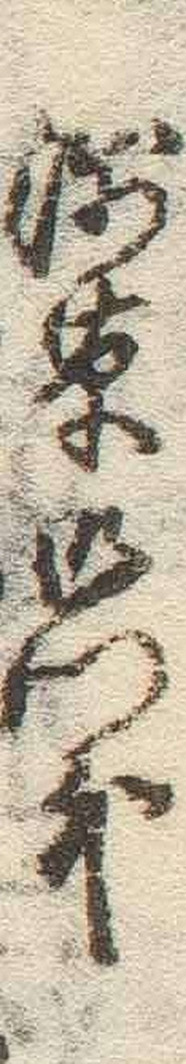浅草御門外
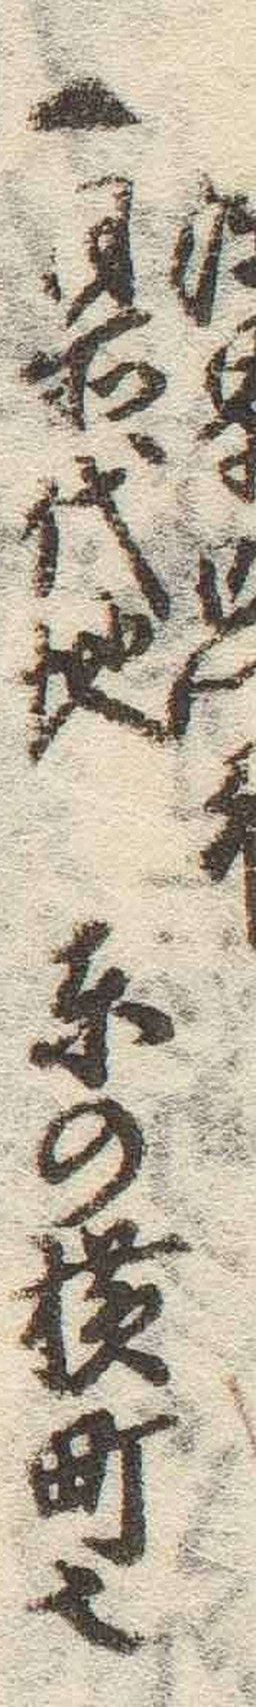▲同所代地東の横町也
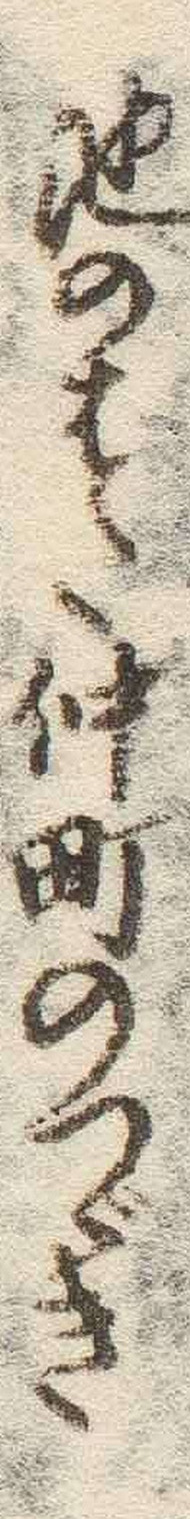池のはた仲町のつゞき
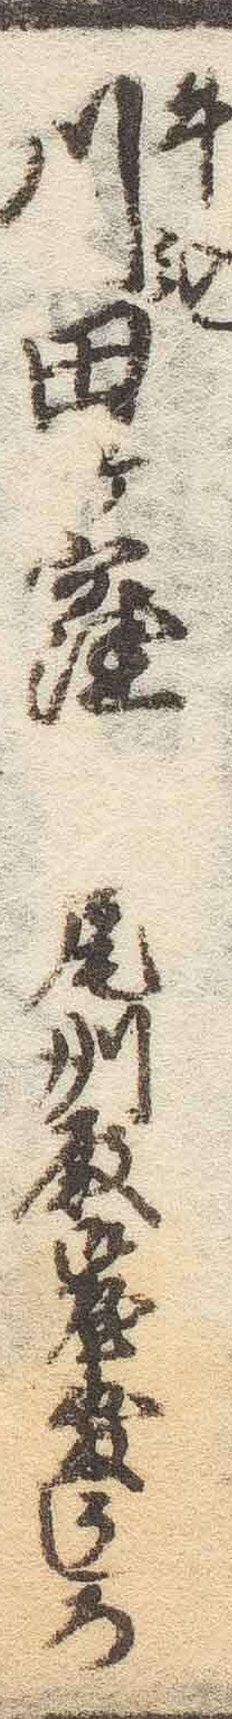川田ヶ窪尾州殿御屋敷うしろ
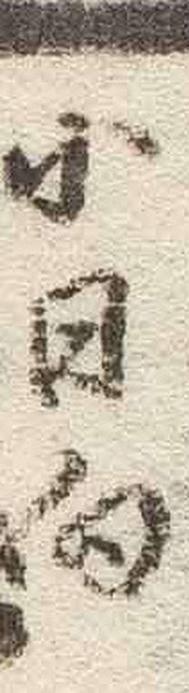小日向
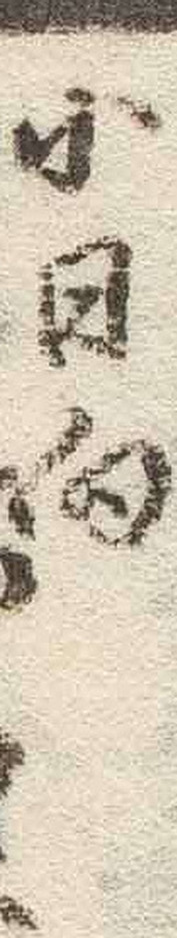小日向
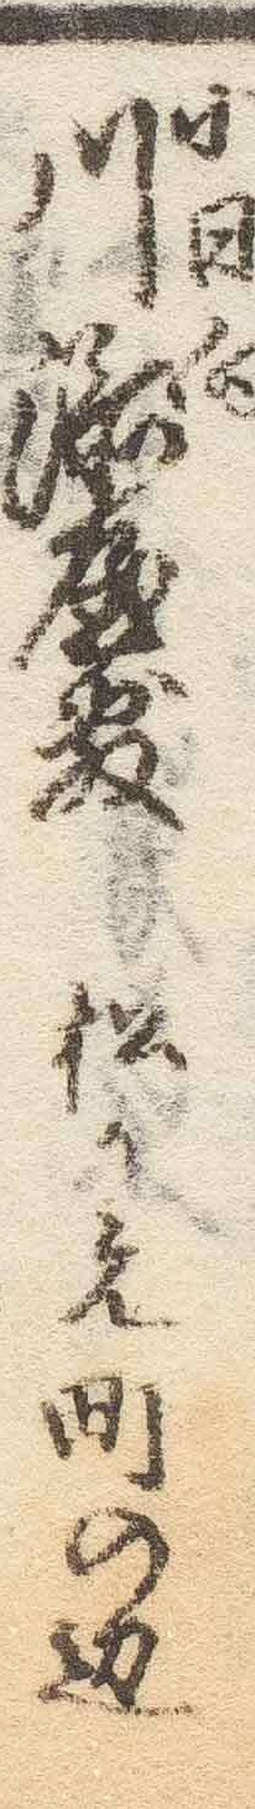川添屋敷松かえ町の辺
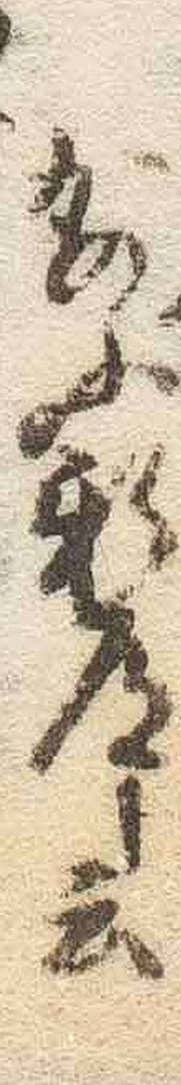かのふ新道と云
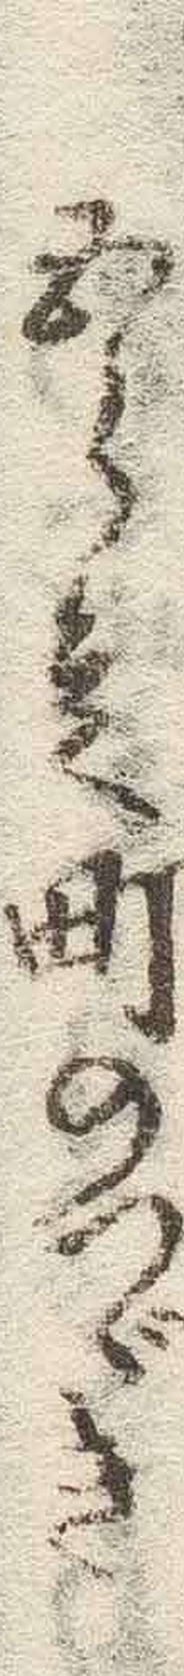五郎兵へ町のつゞき
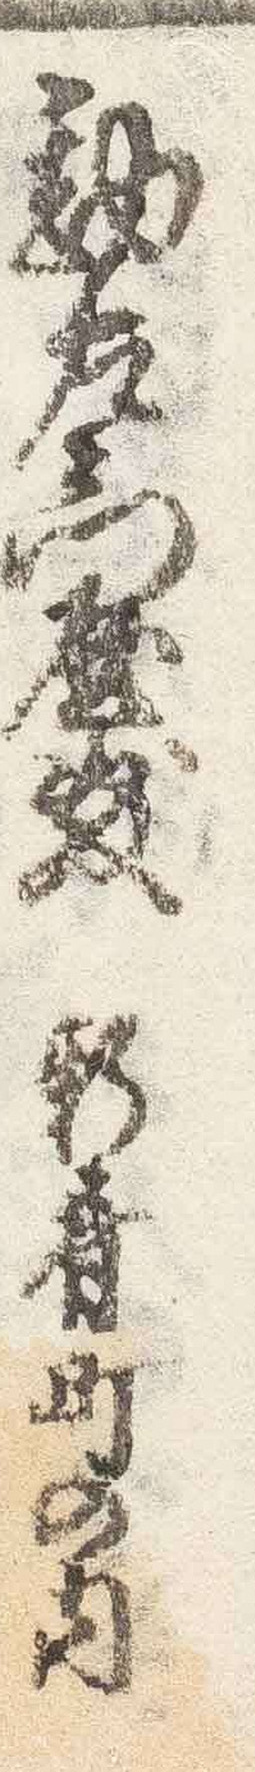勘左衛門屋敷新肴町の内
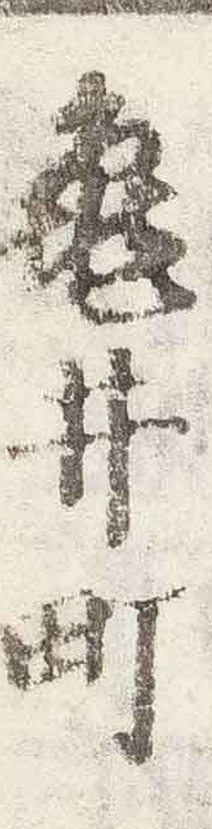亀井町
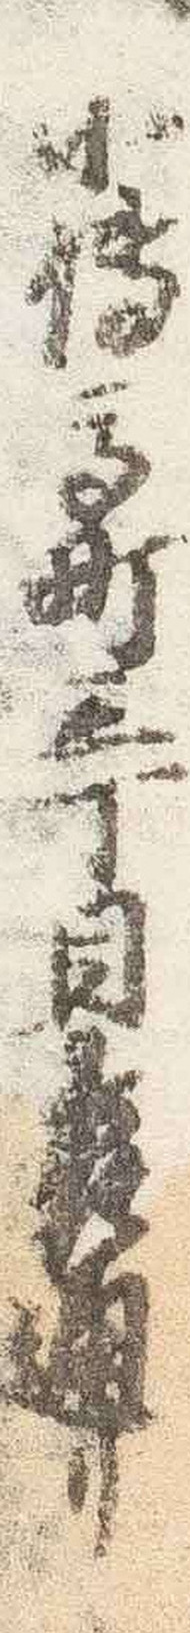小伝馬町三丁目裏通り
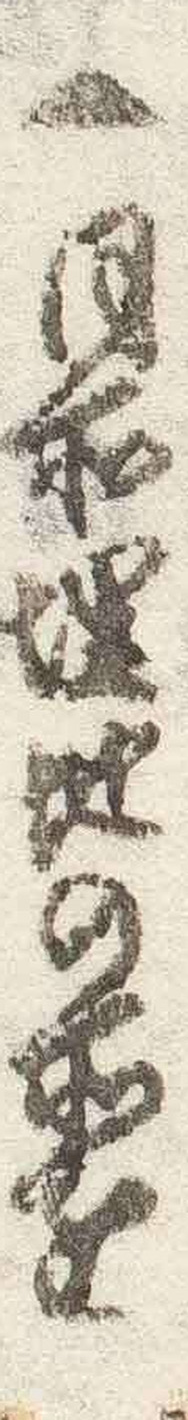▲同所埋地の所を
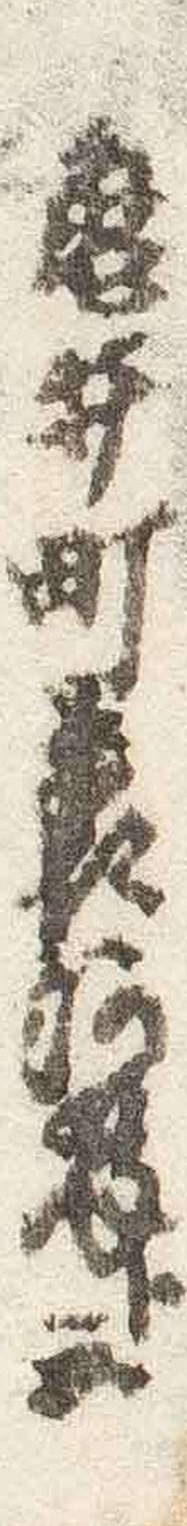亀井町裏河岸と云
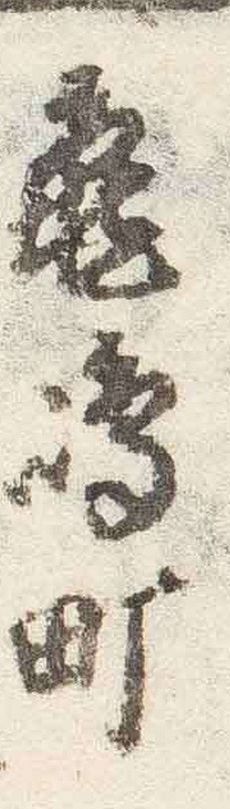亀井町
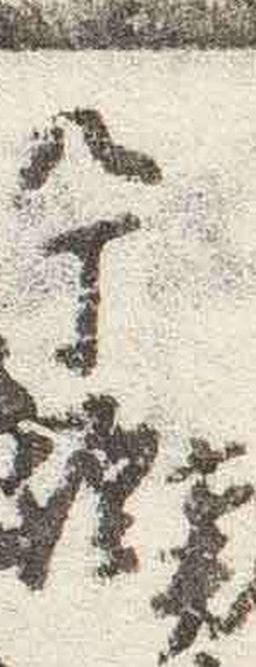八丁堀
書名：江戸町独案内
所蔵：東京学芸大学附属図書館 国文学研究資料館
